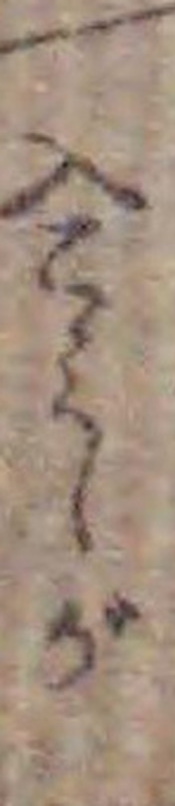入こみしが
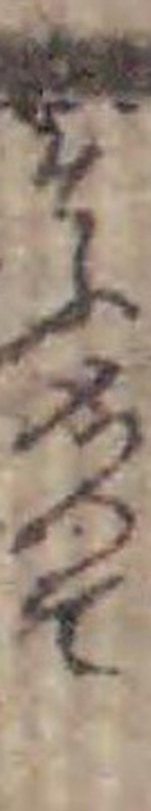そふ思つて
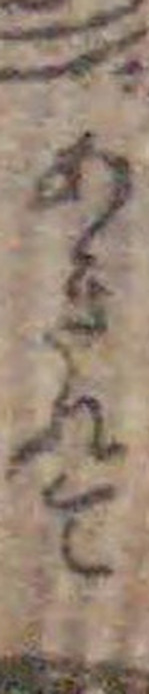あきれて
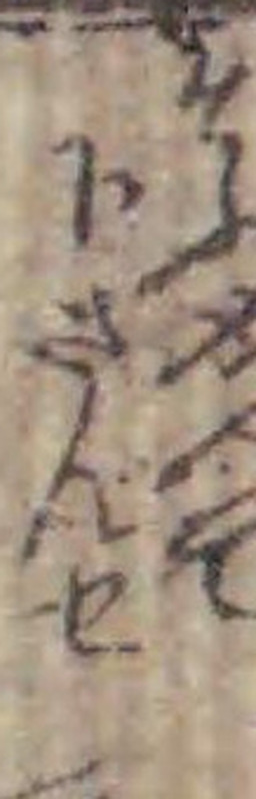下さんせ
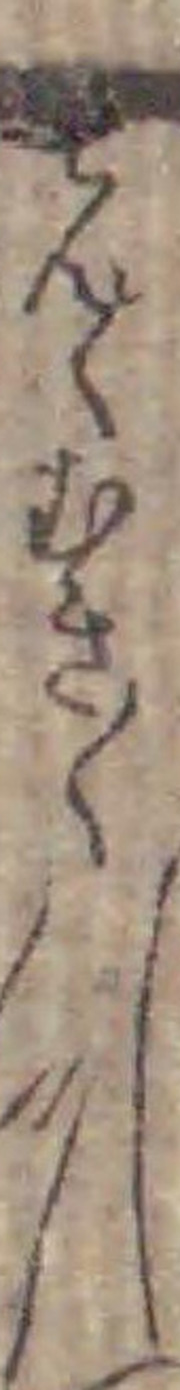てん〳〵むき〳〵
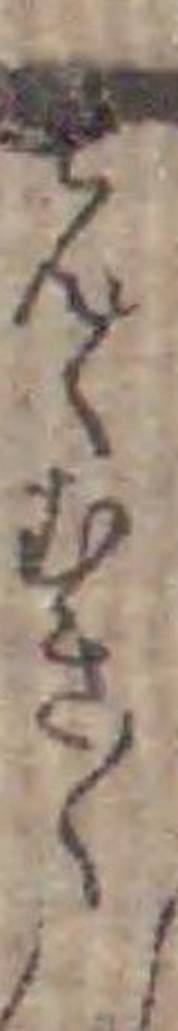てん〳〵むき〳〵
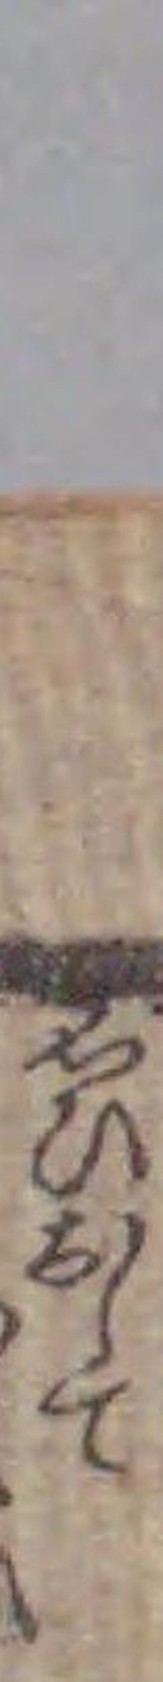思ひおして
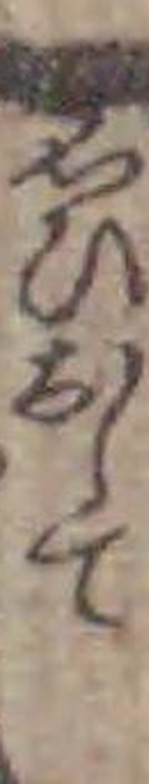思ひおして
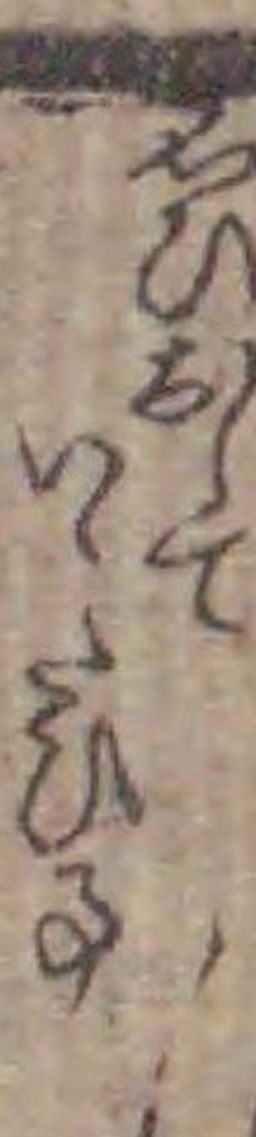いゝたひ事
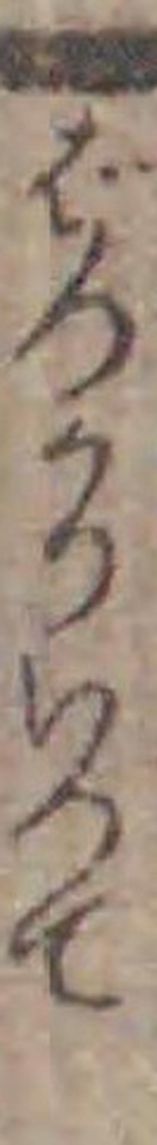ばつかりいつて
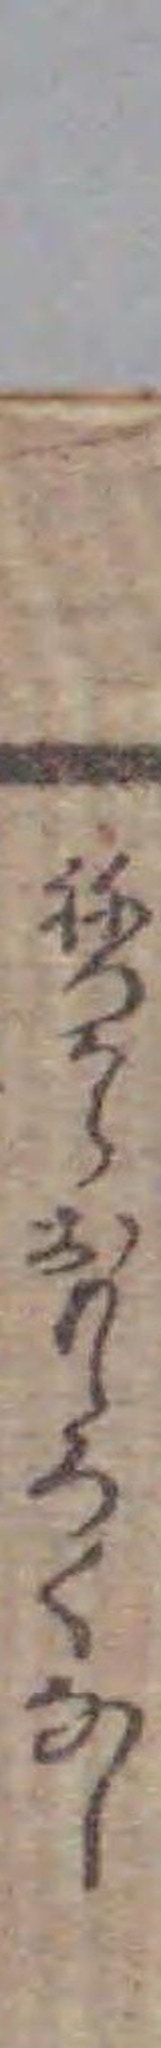ねつからおもしろくなし
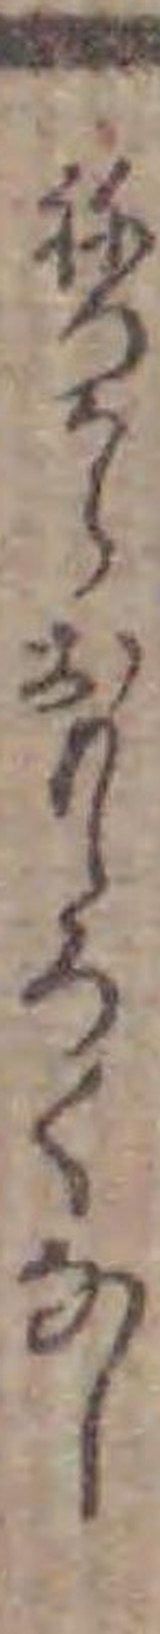ねつからおもしろくなし

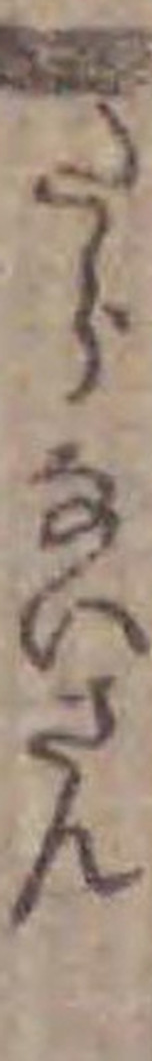たらないさん
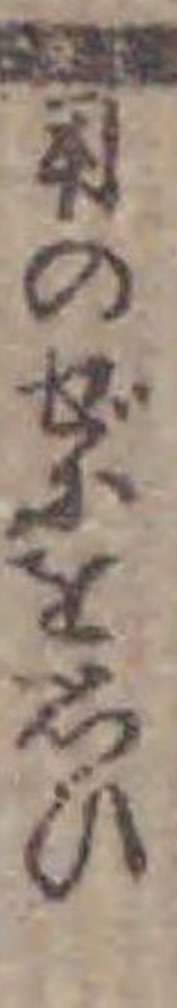用のぜにを思ひ
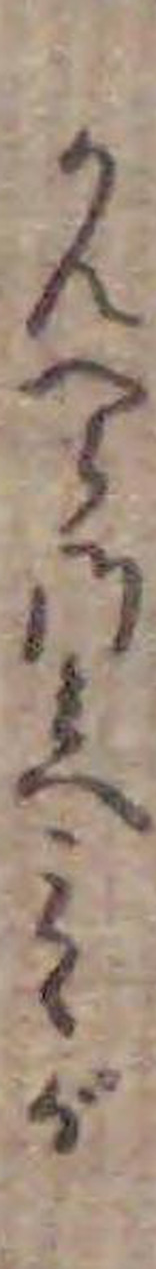かんへら門とへみゝが
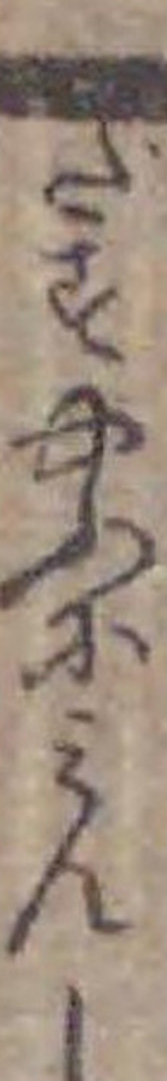だすやふにみん
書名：年寄之冷水曽我 : 3巻
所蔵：国立国会図書館 National Diet Library, JAPAN
